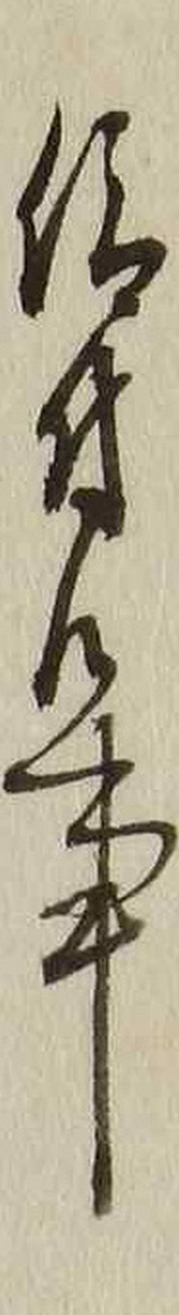仰付候事
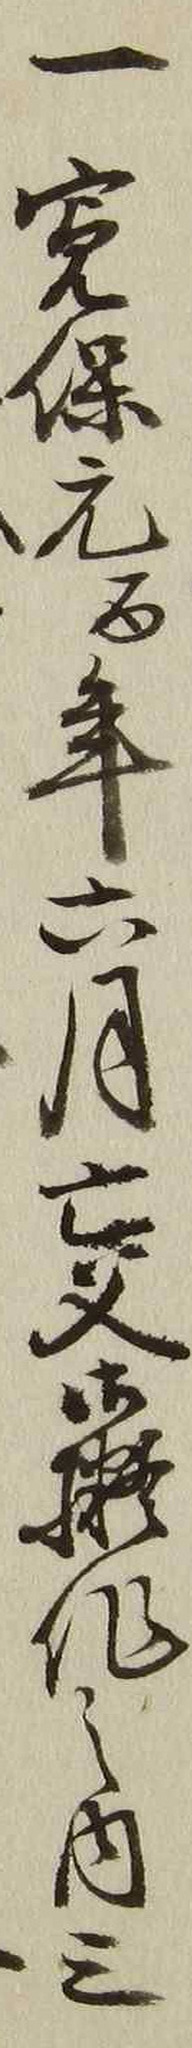一寛保元酉年六月亡父御擬作之内三
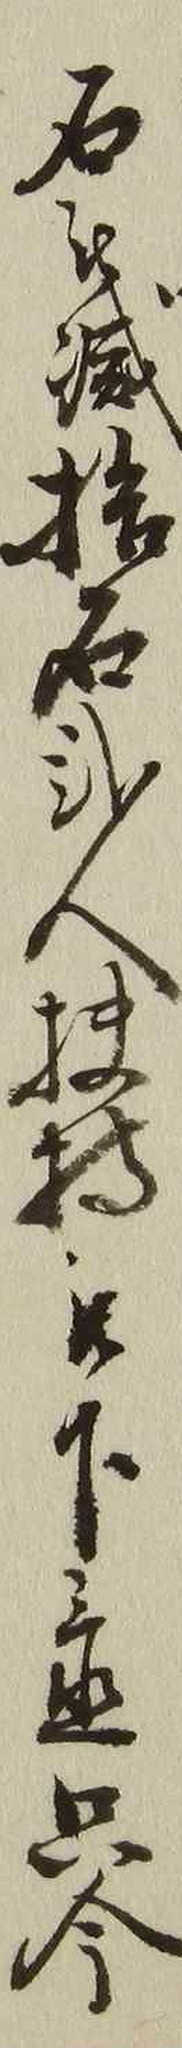石被減拾石弐人扶持被下置只今
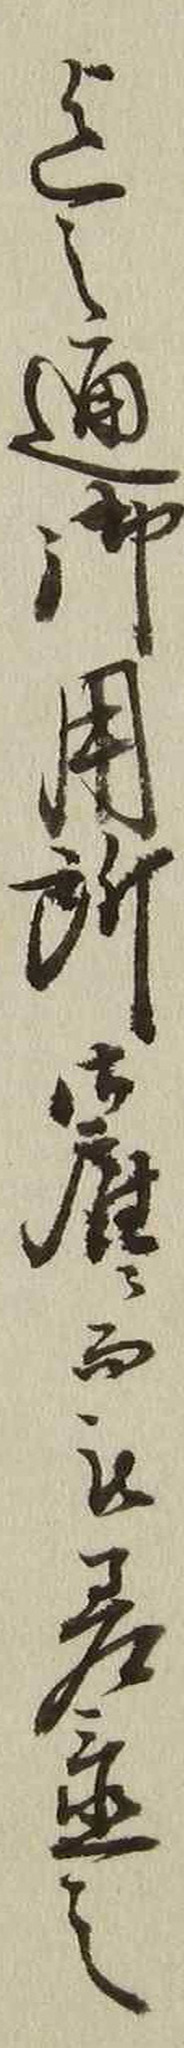迄之通御用所御雇ニ而被差置之
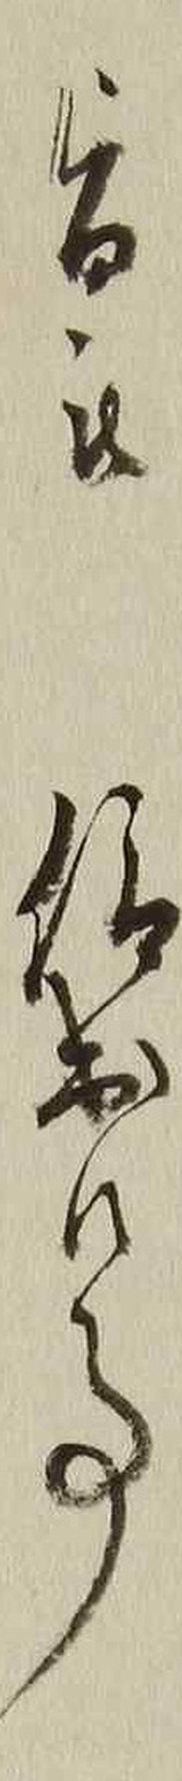旨被仰出候事
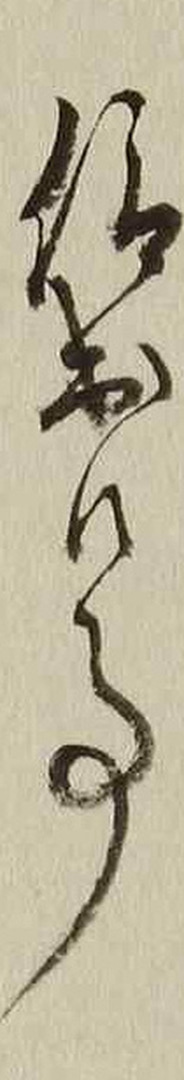仰付候事
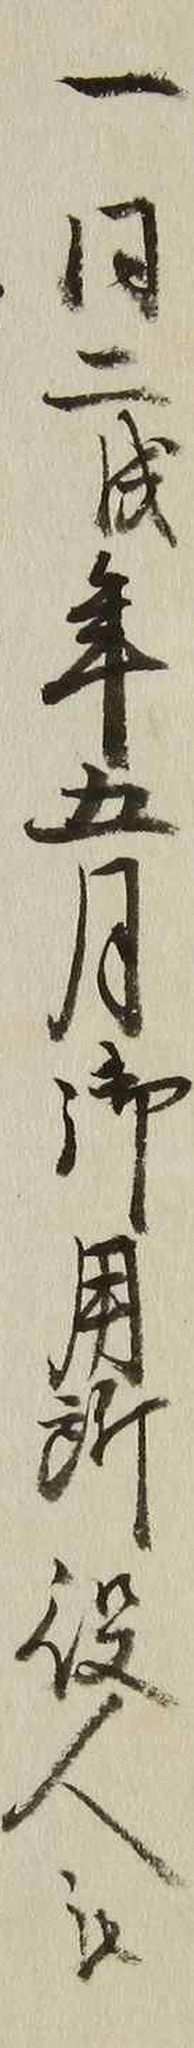一同二戌年五月御用所役人被
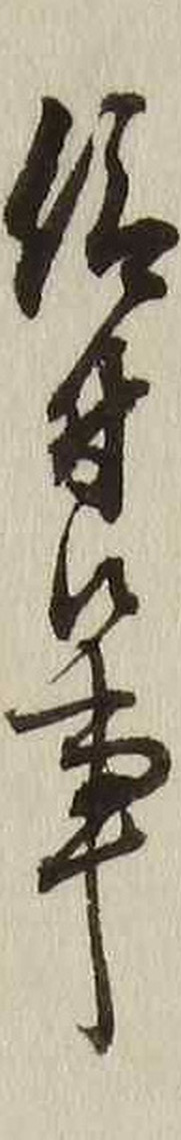仰付候事
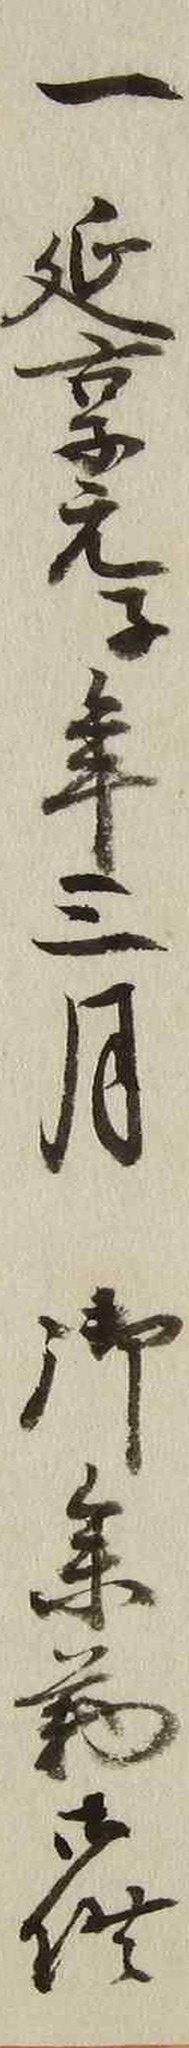一延享元子年三月御参勤御供
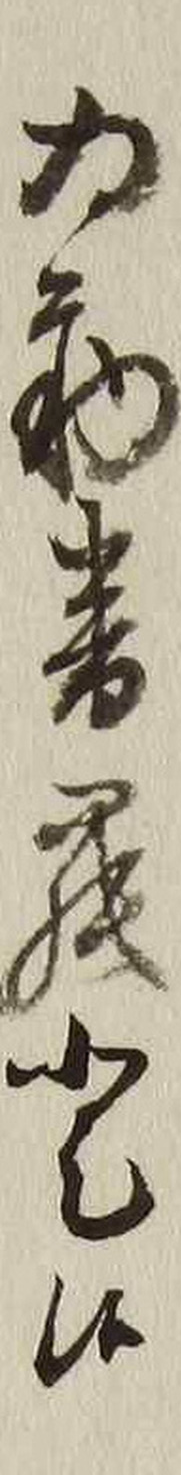為勤番罷登候
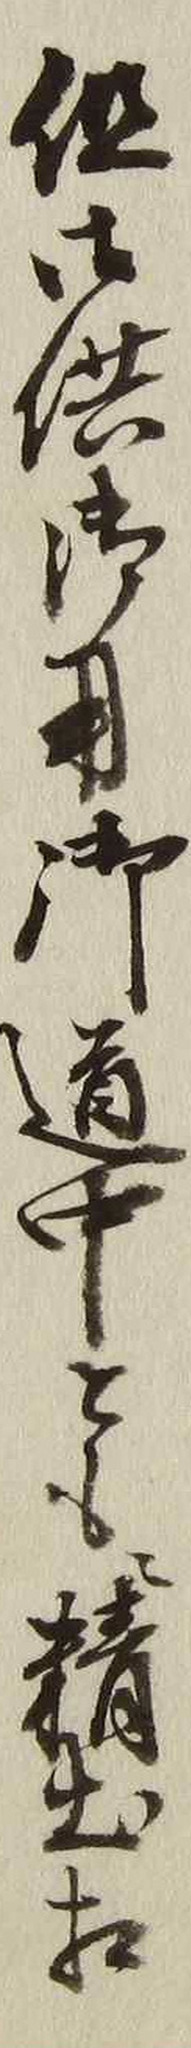但御供御用御道中ともニ精出相
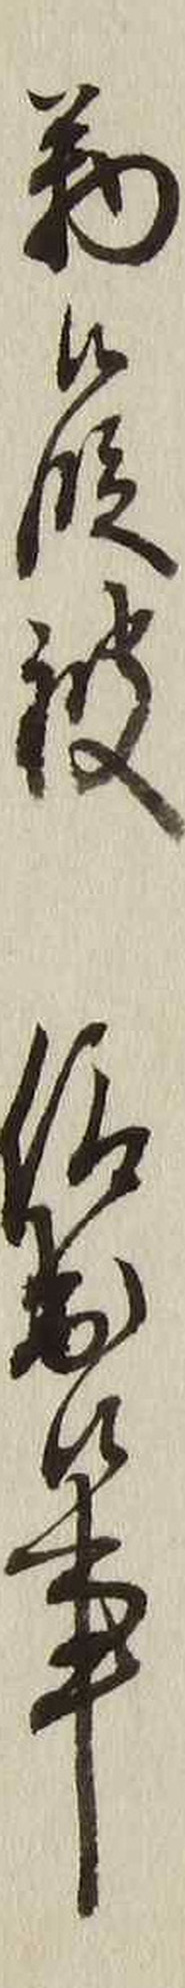勤候段被仰出候事
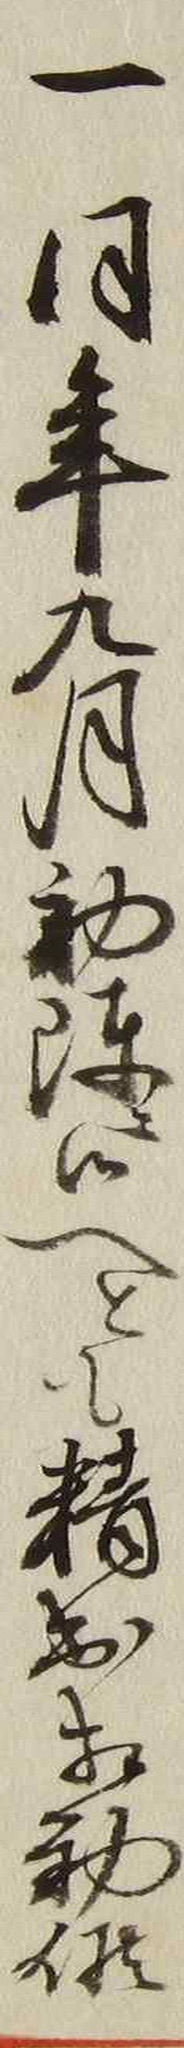一同年九月初陣ニ候へとも精出相勤候
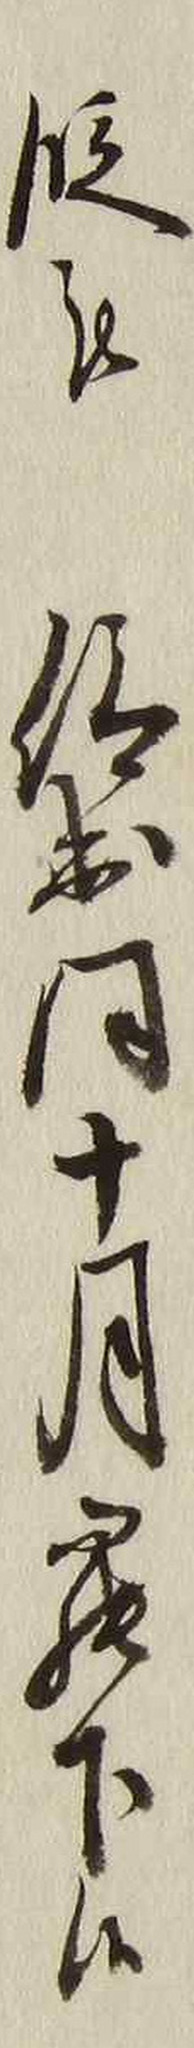段被仰出同十月罷下候
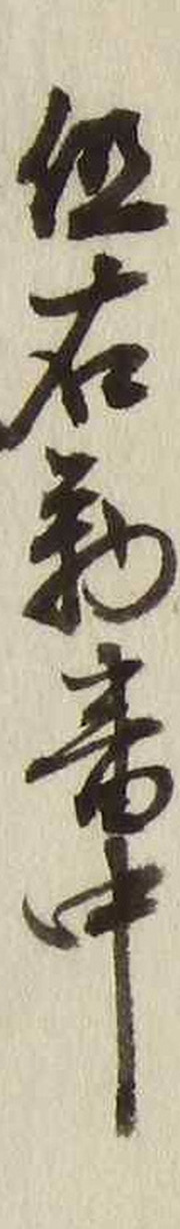但右勤番中
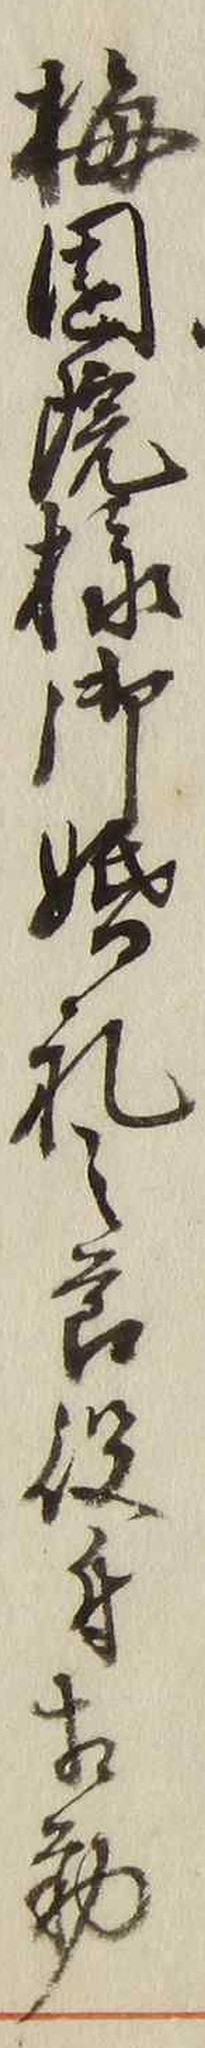梅園院様御婚礼之節役付相勤
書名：諸士系譜　巻之27　い之部27
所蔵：会津若松市立会津図書館
